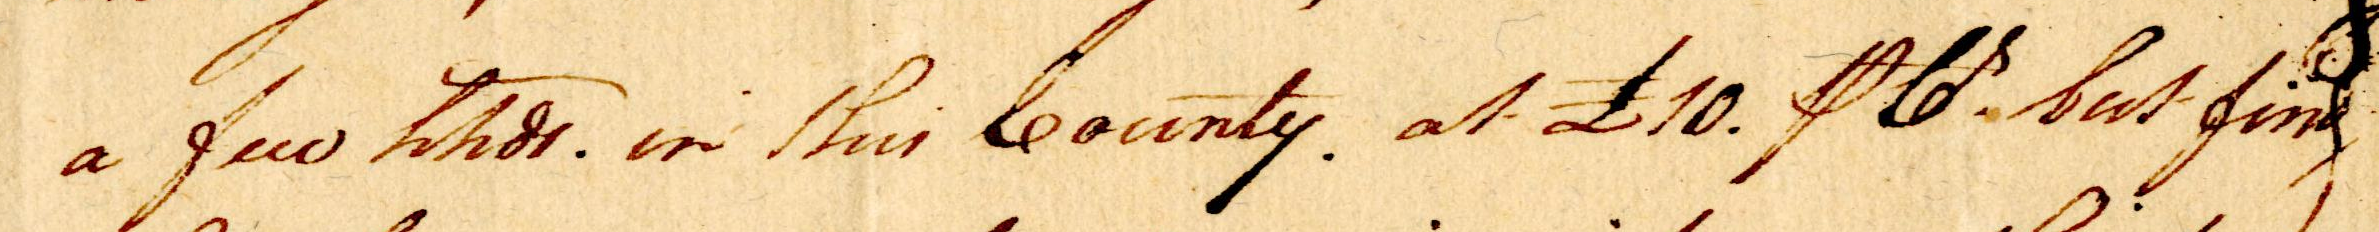a few hhds. in this County at £10 per 6^s. but find
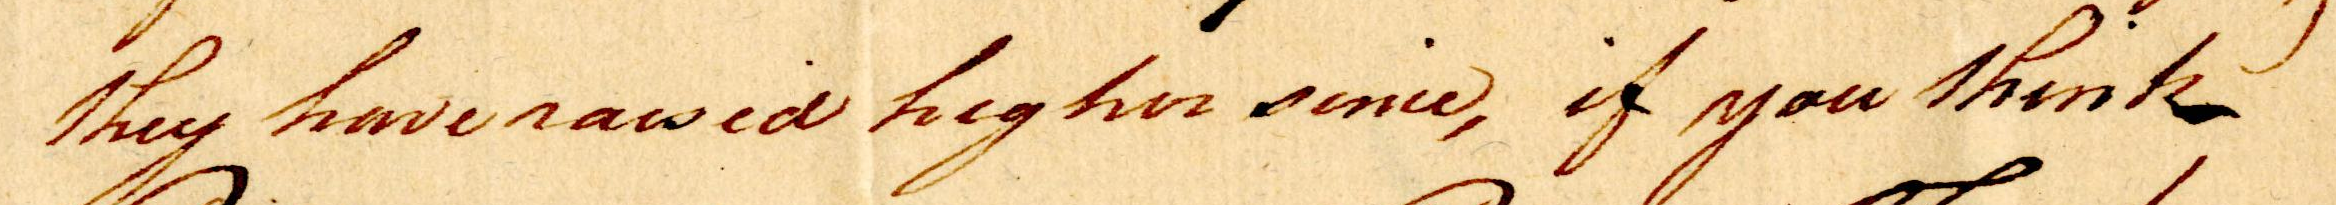they have rawed higher since, if you think
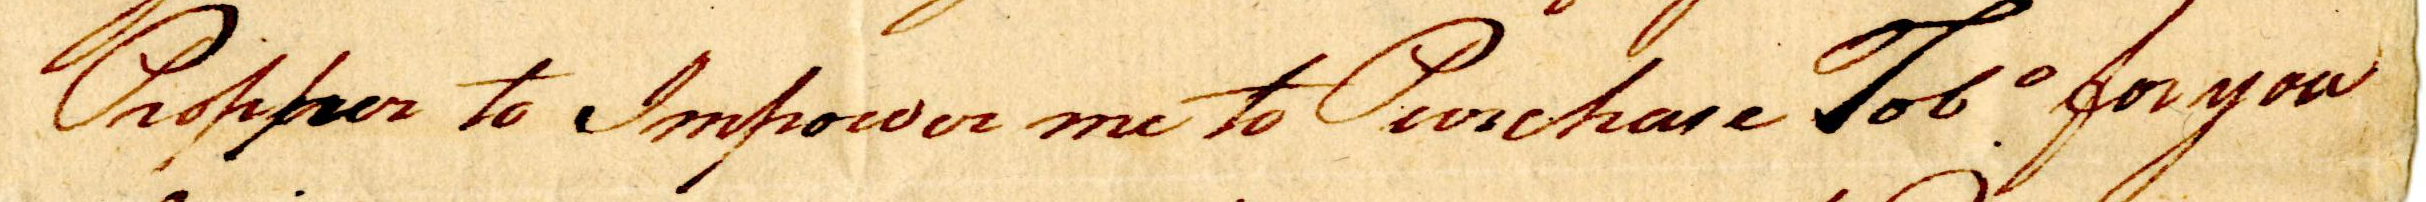Propper to Impower me to Purchase Tob^o for you
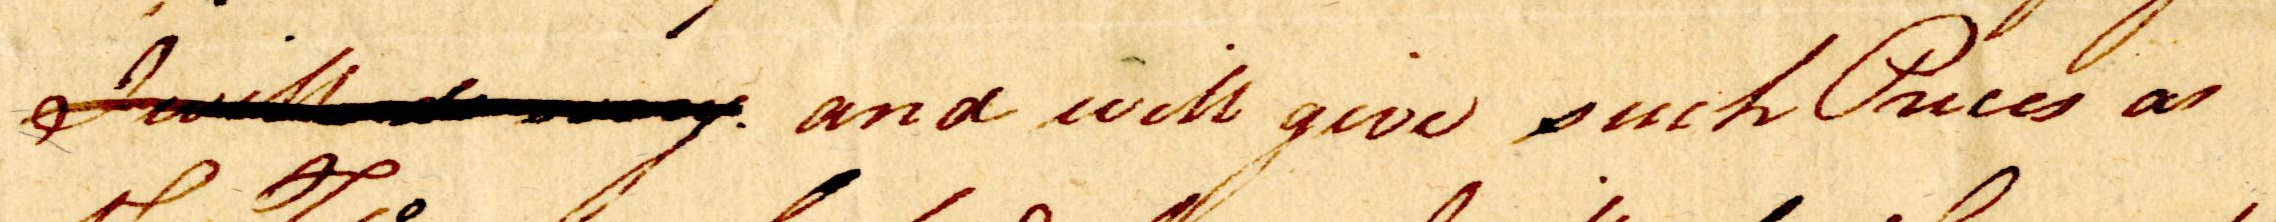[I will ______] and will give such Prices as
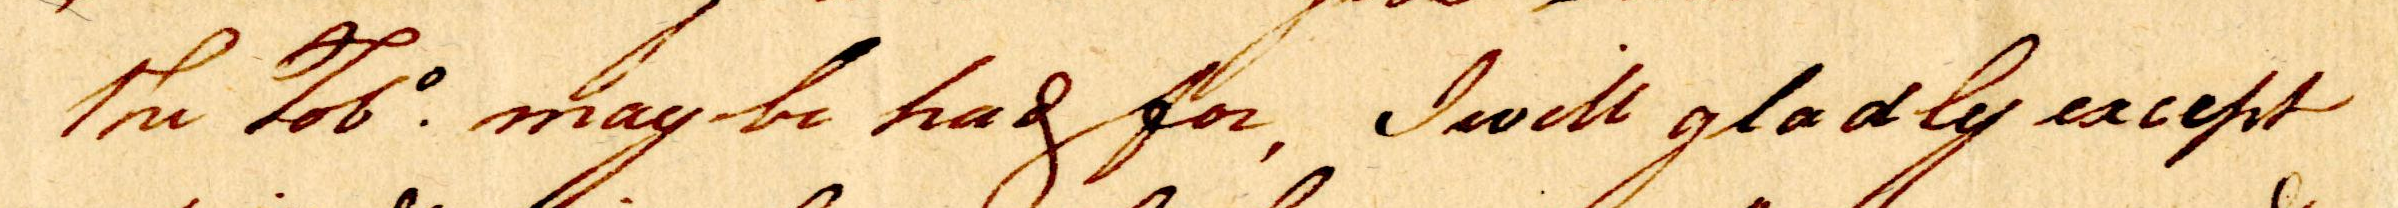the Tob^o. may be had for, I will gladly except
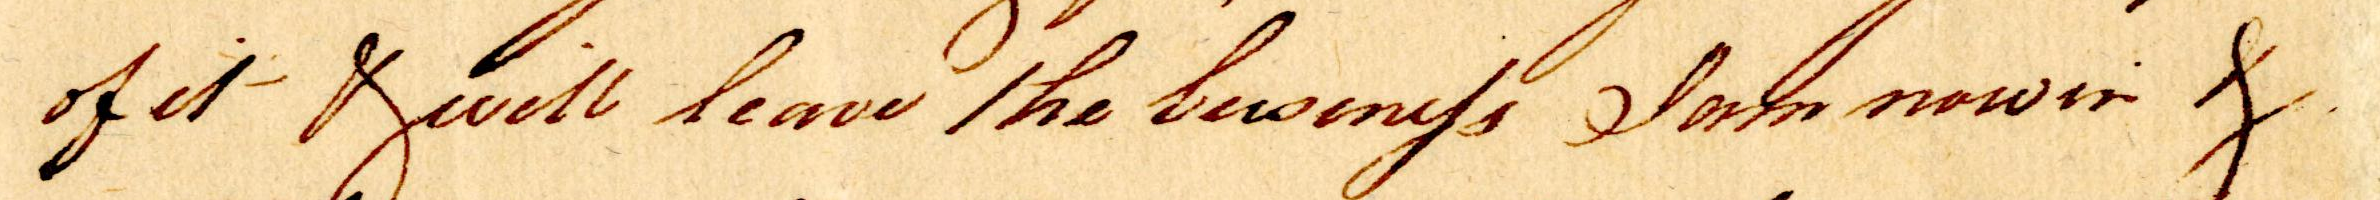of it & will leave the business I am now in &
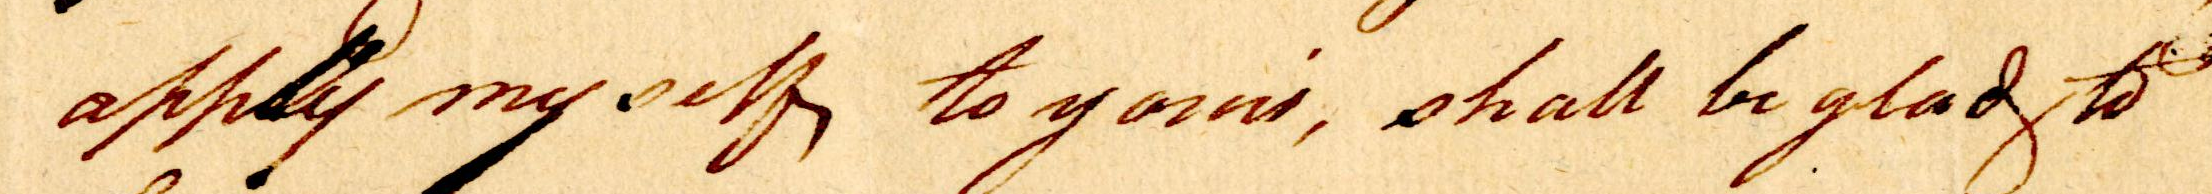apply my self to yours, shall be glad to
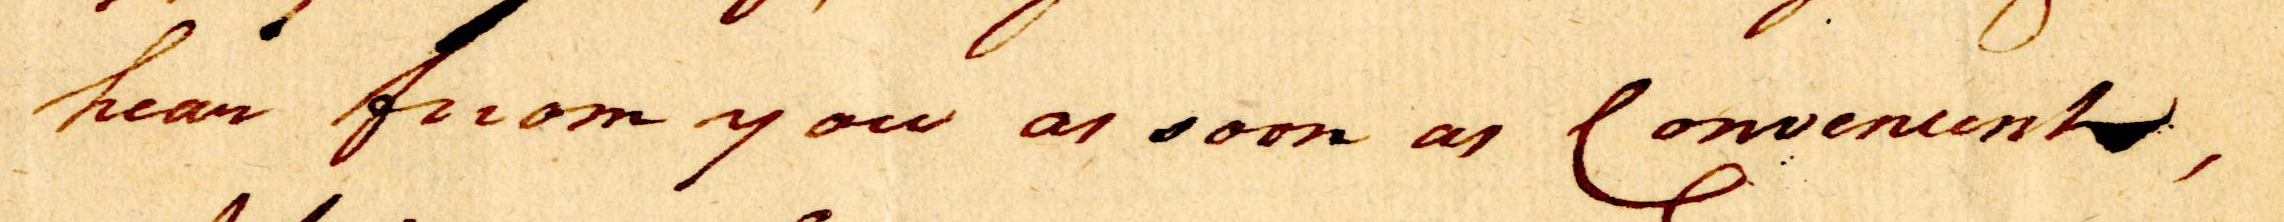hear from you as soon as Convenient,
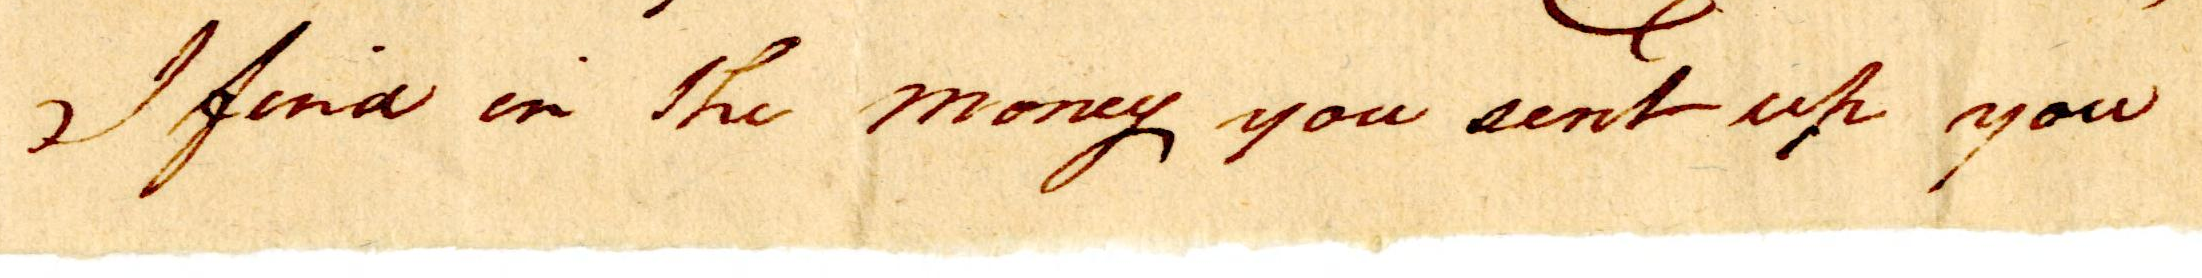I find in the money, you sent up you
